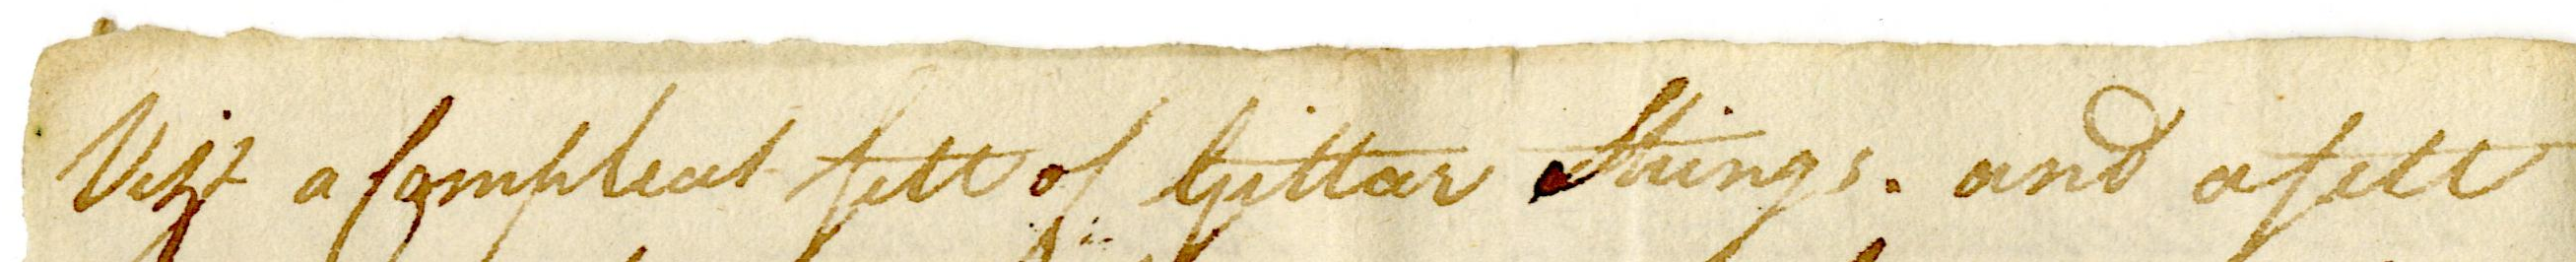Vizt a Compleat sett of Gittar Strings and a sett
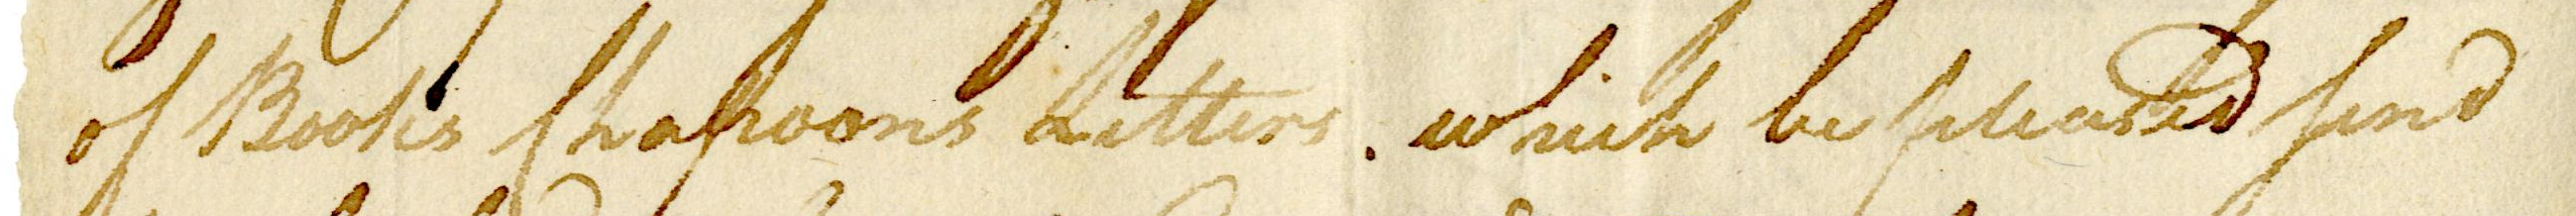of Books Chapoons Letters, which be pleased find
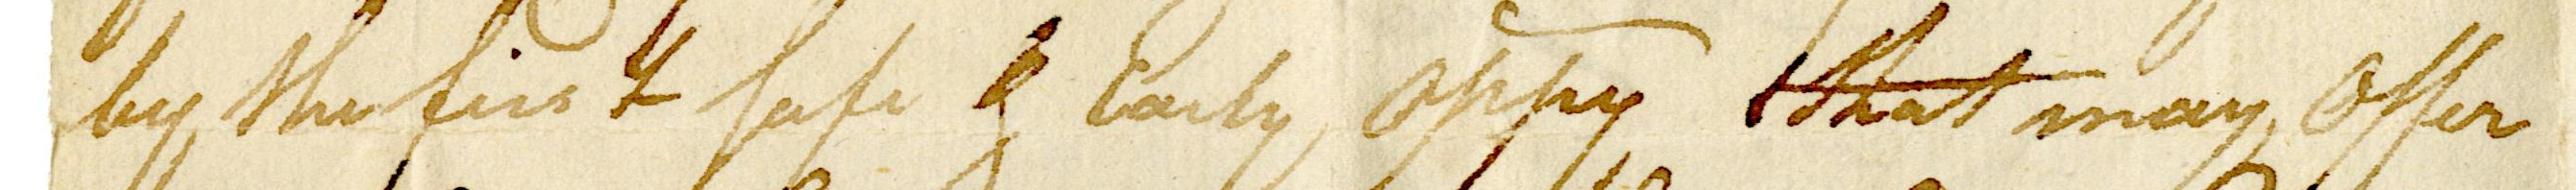by the first safe & Early oppy that may Offer
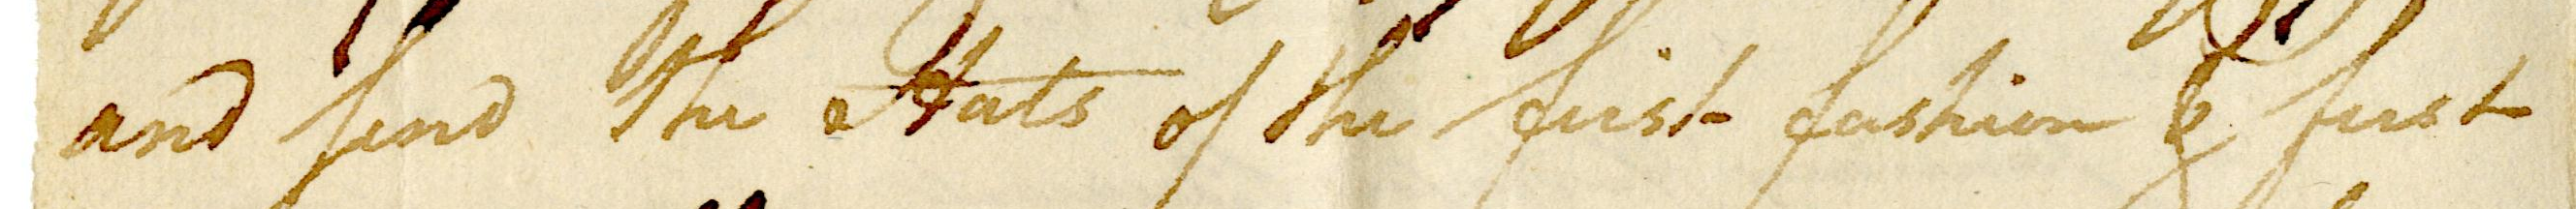and send the Hats of the first fashion & first
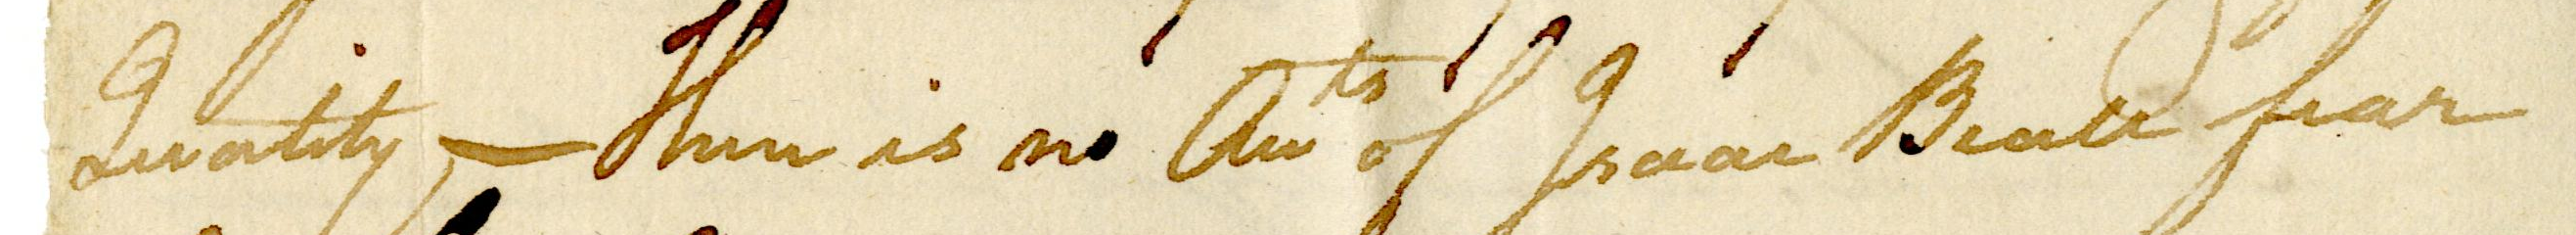Quantity- There is no Acc^ts of Issac Beall fear
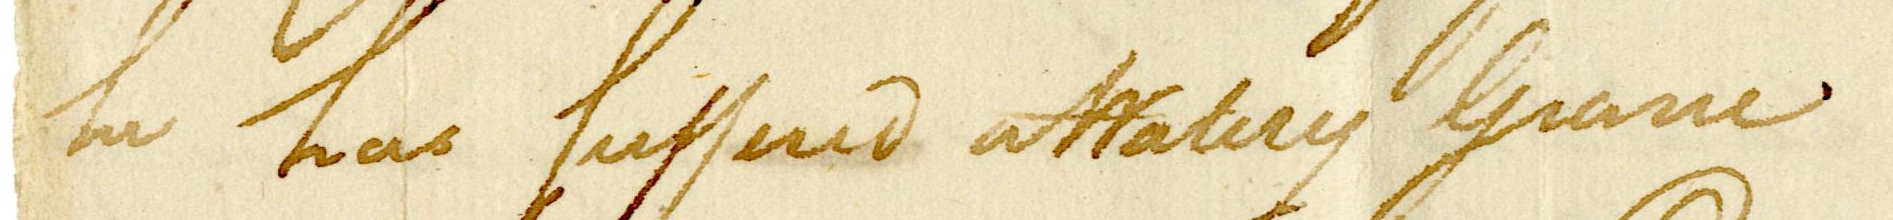he has suffered a Watery Grave
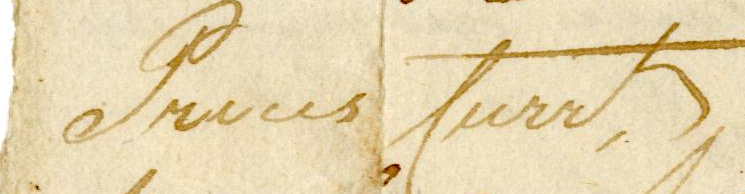Prices Curr^t.
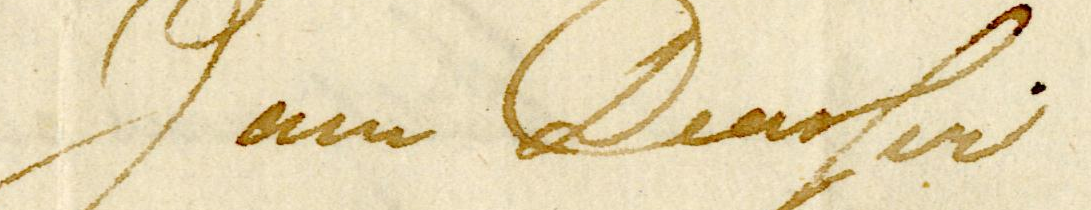I am Dear Sir
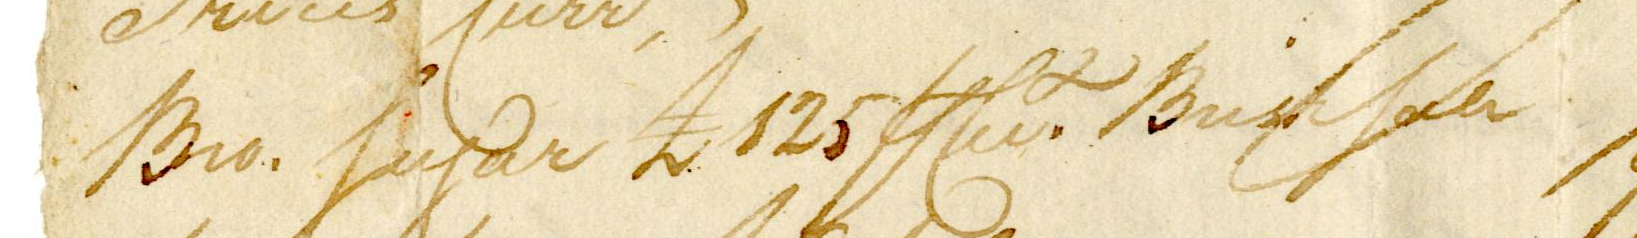Bro. sugar £125 per Cu^t. Brisk sale
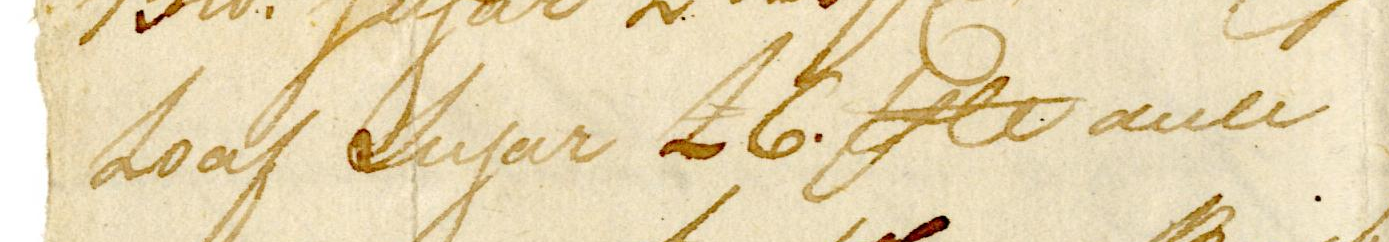Loaf sugar £6 perce dull
